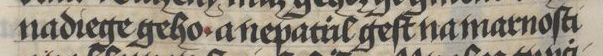nadiege geho.a nepatṙil geſt na marnoſti
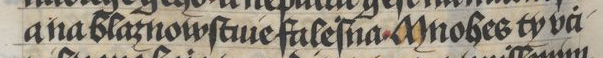a na blaznowſtuíe faleẛna.Mnohes ty vċi¬
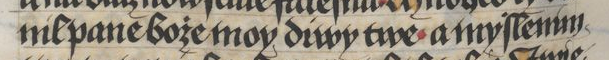nil pane boże moy díwy twe.a myẛlením
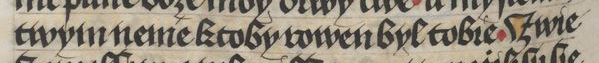twym neníe ktoby rowen byl tobie.Zwie¬
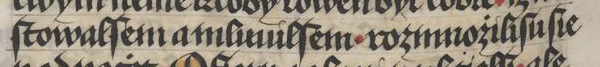ſtowalſem a mluuilſem.rozmnożiliſu ſie
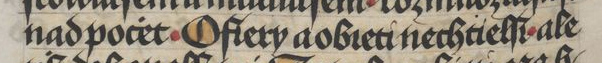nad poċet.Oſíery a obieti nechtíelſi.ale
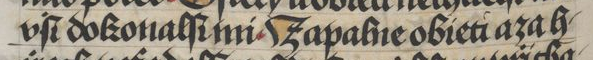vẛi dokonalſi mi.Zapalne obieti a za h¬
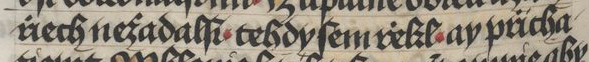ṙiech neżadalſi.tehdy ſem ṙekl.ay pṙicha¬
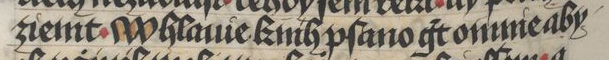zimt.W hlauie kníh pſano ḡt omnie aby¬
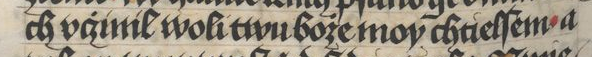ch vcżíníl woli twu boże moy chtielſem.a
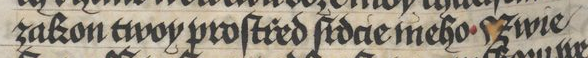zakon twoy proſtřed ſrdcie meho.Zwie¬
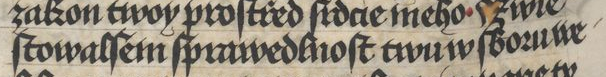ſtowalſem ſprawedlnoſt twu w ſboru we¬
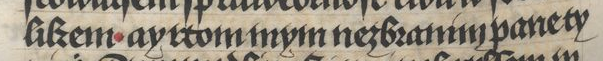likem.ay rtom mym nezbraním pane ty
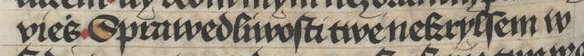víeṡ.Sprawedliwoſti twé nekrylſem w
